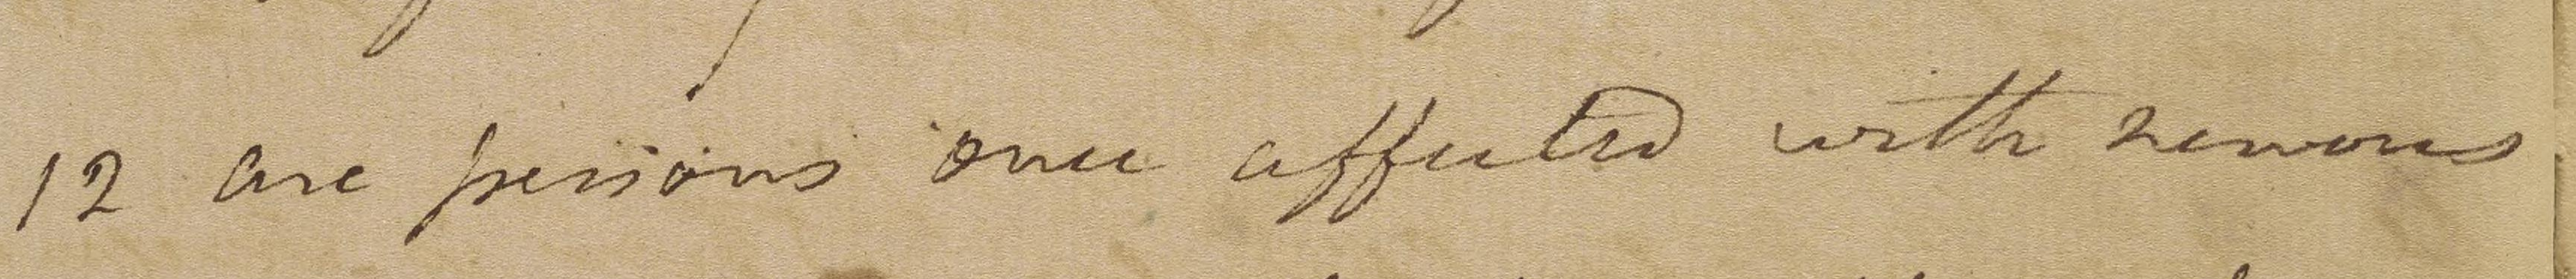12 Are persons once affected with nervous
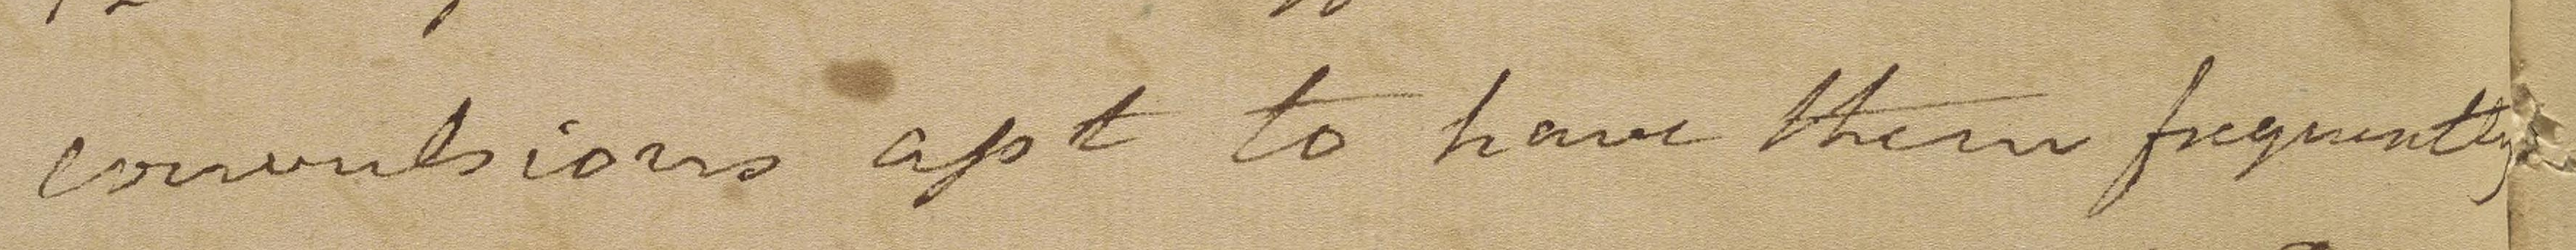convulsions apt to have them frequently
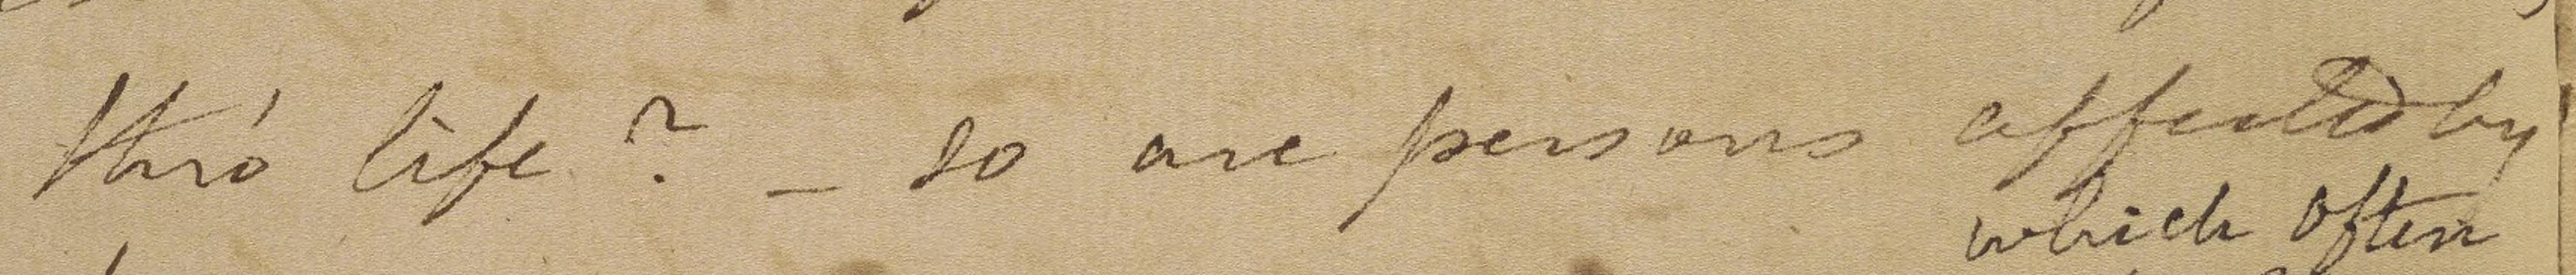thro' life?- So are persons affected by
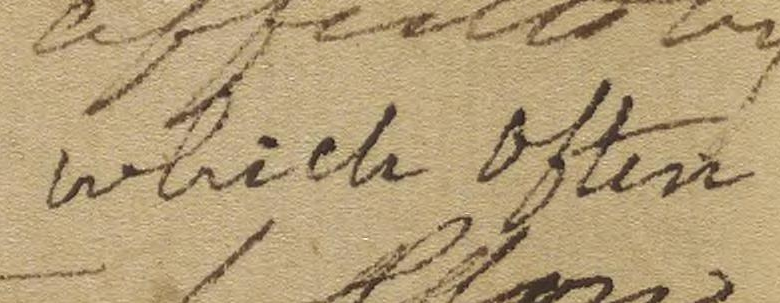which often
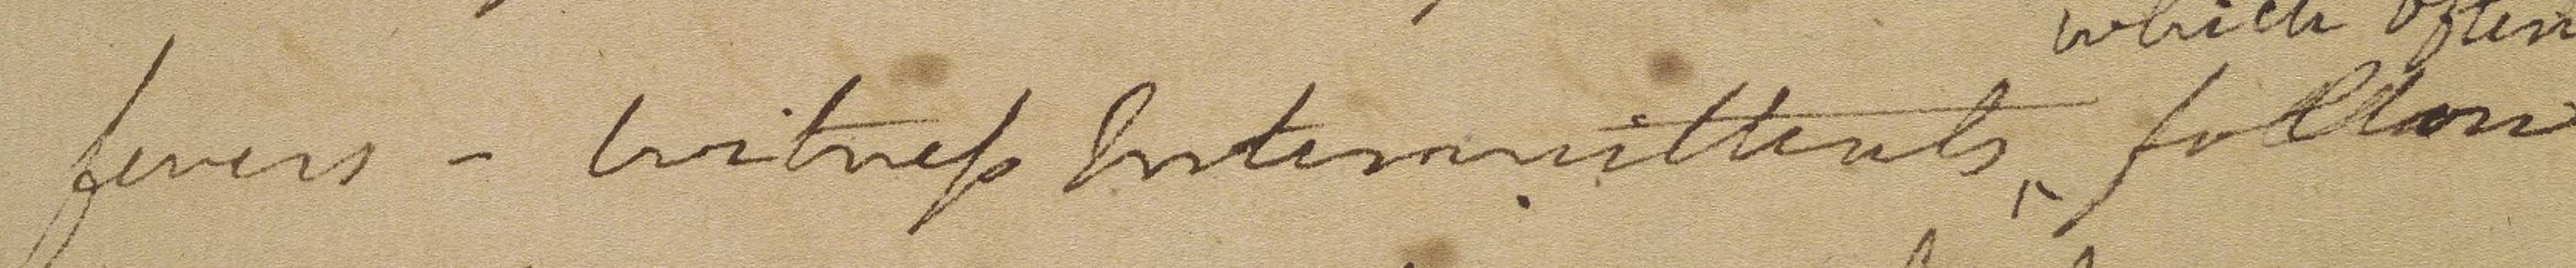fevers. Witness intermittents ^ follow
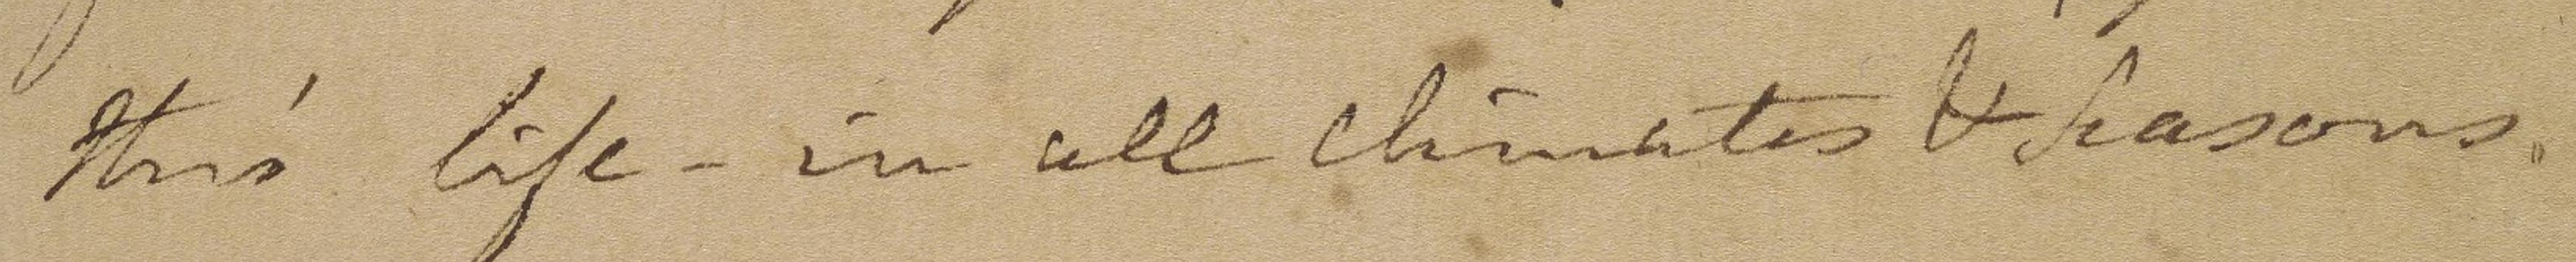this life in all climates & seasons.
